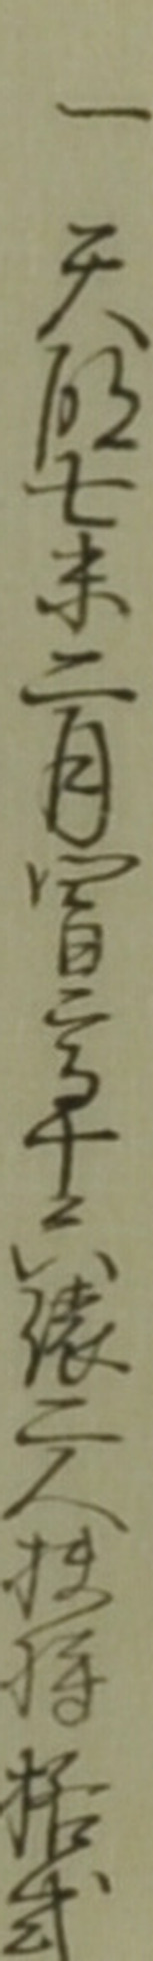一天明七未二月四日高十六俵二人扶持格式
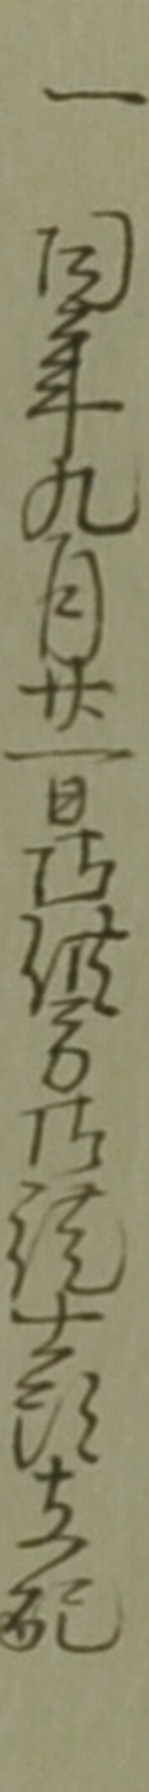一同年九月廿一日御供方御徒士頭支配
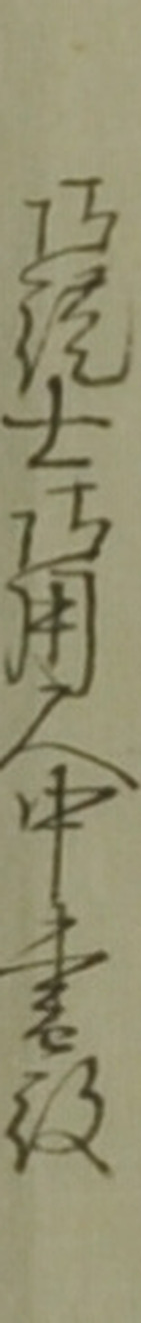御徒士御用人中書役
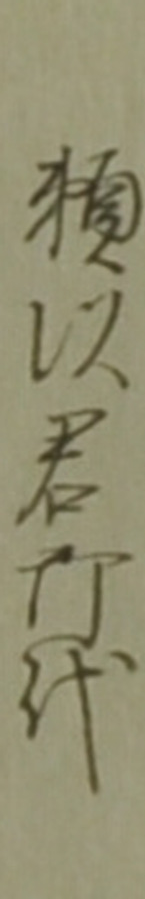頼以君御代
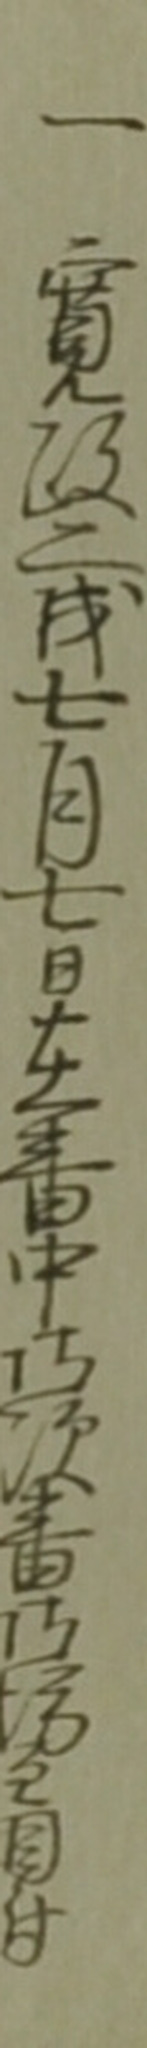一寛政二戌七月七日在番中御次番御坊主目付
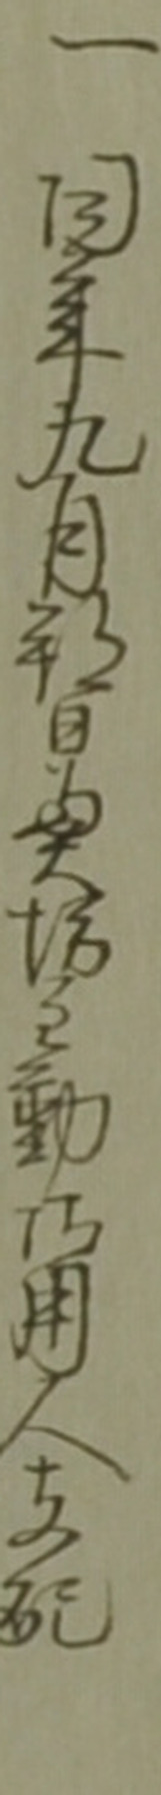一同年九月朔日奥坊主勤御用人支配
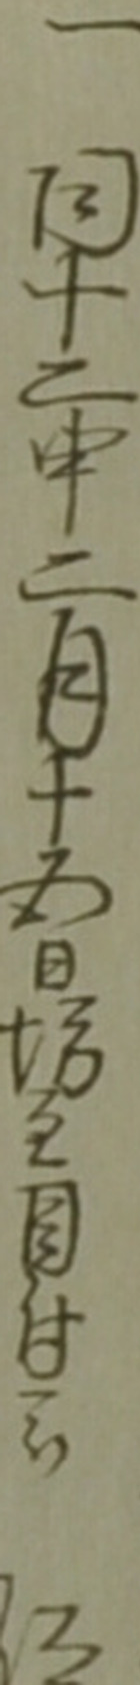一同十二申二月十五日坊主目付被仰付
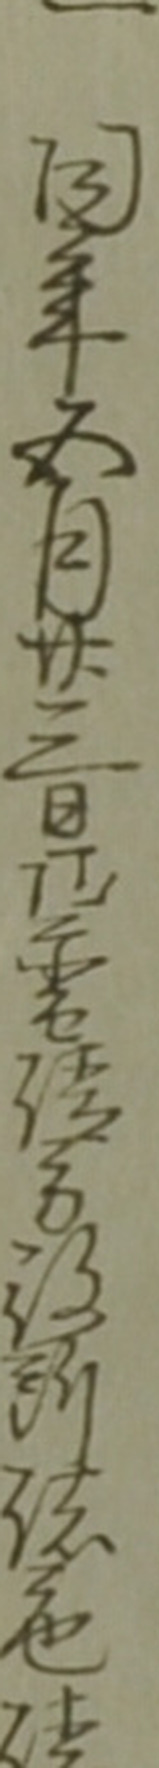一同年五月廿三日御普請方役所諸色請払
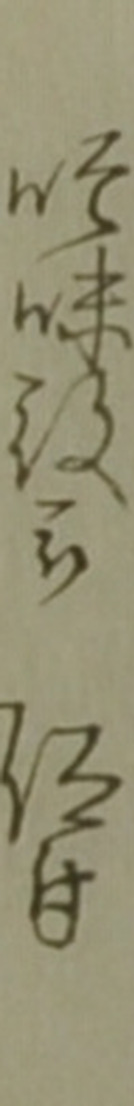吟味役被仰付
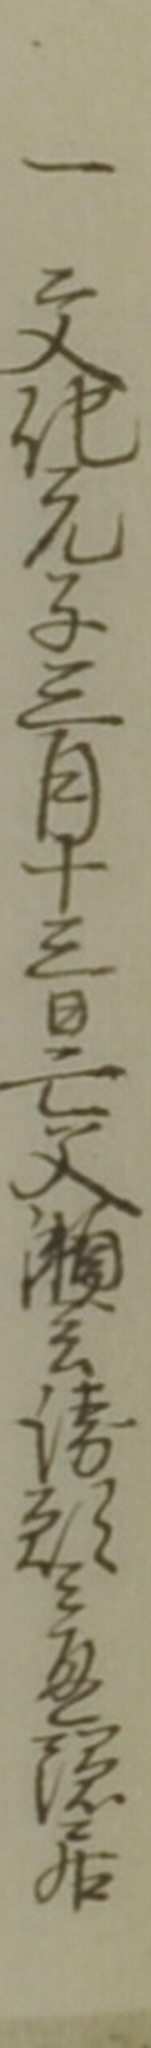一文化元子三月十三日亡父瀬兵衛願之通隠居
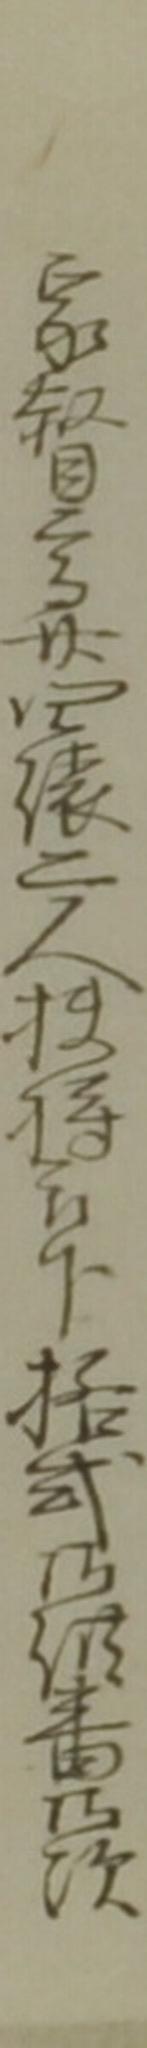家督高廿四俵二人扶持被下格式御供番御次
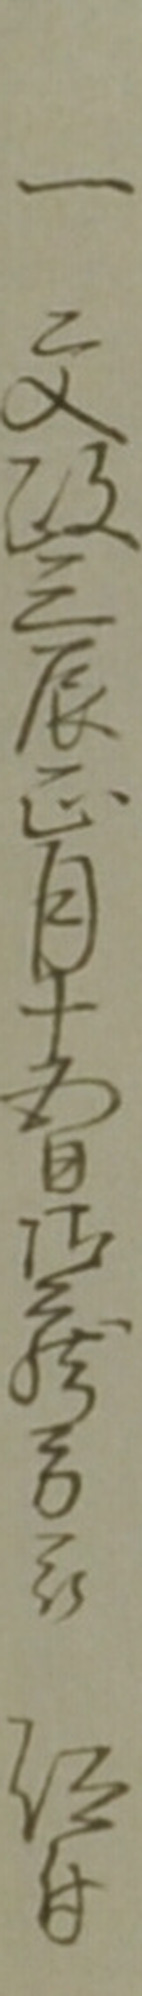一文政三辰正月十五日御蔵方被仰付
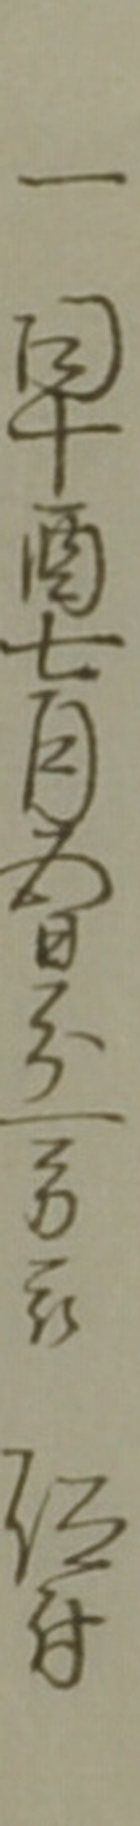一同十酉七月五日分一方被仰付
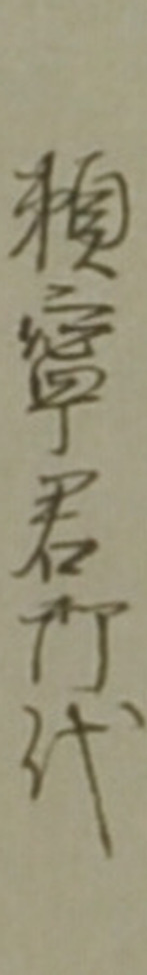頼寧君御代
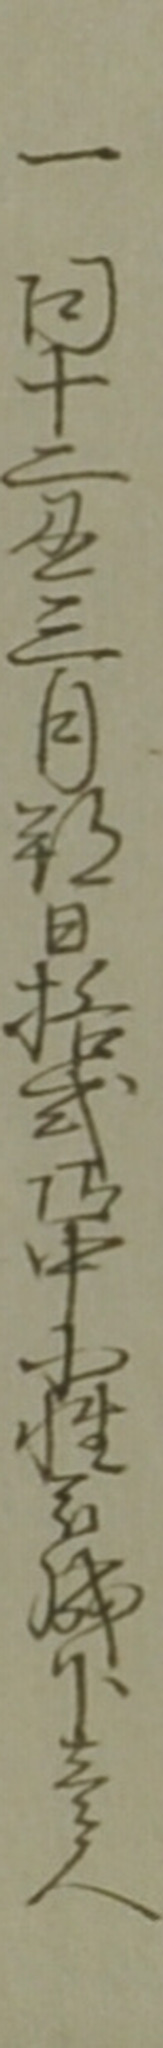一同十二丑三月朔日格式御中小性被成下壱人
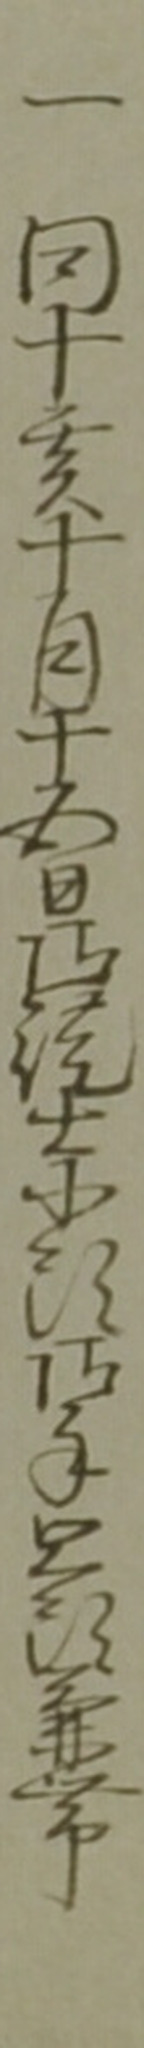一同十亥十月十五日御徒士小頭御手廻頭兼帯
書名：無足諸士勤仕録（二）
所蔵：伊那市立高遠町図書館・合同会社AMANE
